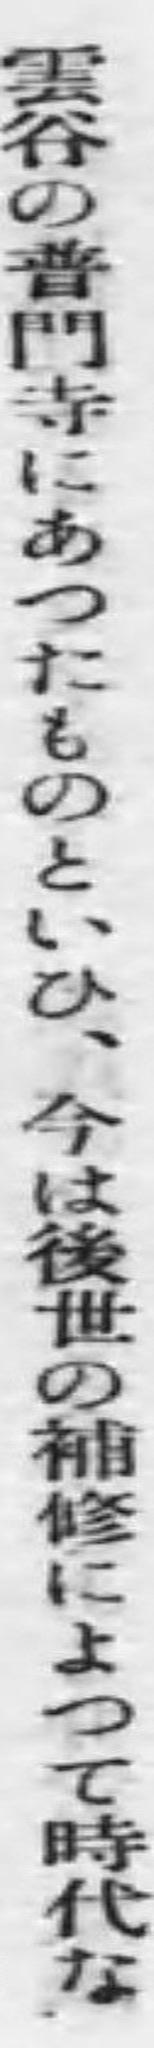雲谷の普門寺にあつたものといひ、今は後世の補修によつて時代な
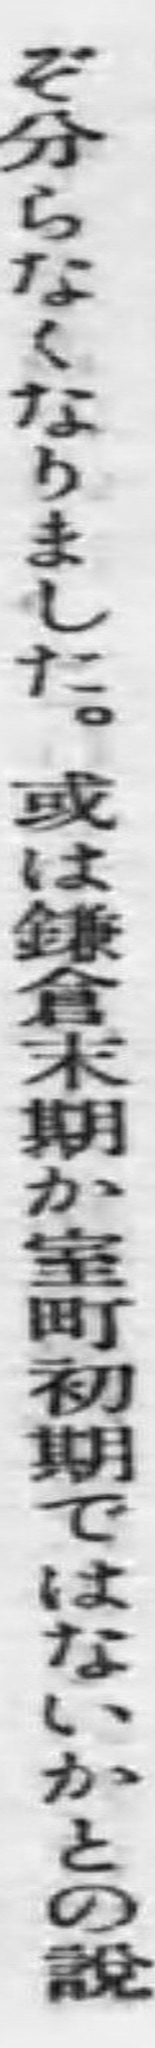ぞ分らなくなりました。或は鎌倉末期か室町初期ではないかとの説
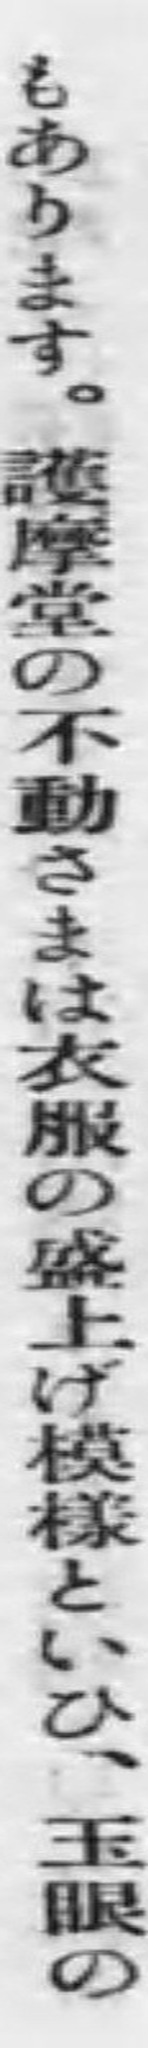もあります。護摩堂の不動さまは衣服の盛上げ模様といひ、玉眼の
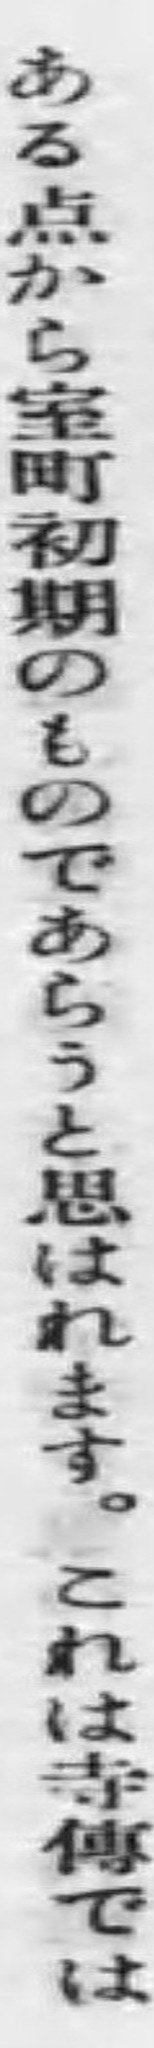ある点から室町初期のものであらうと思はれます。これは寺伝では
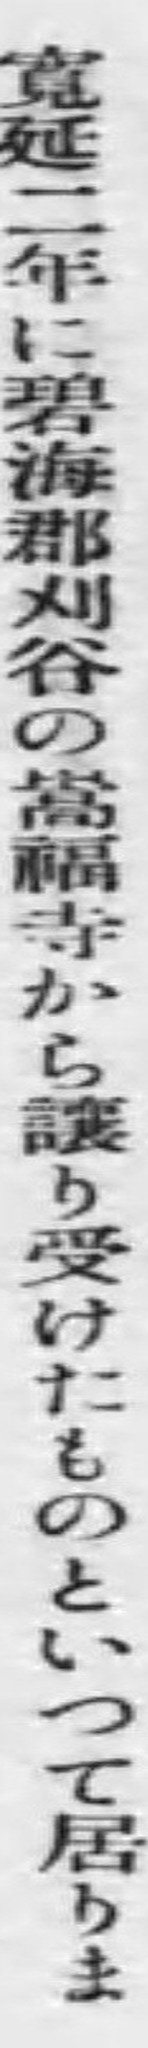寛延二年に碧海郡刈谷の嵩福寺から譲り受けたものといつて居りま
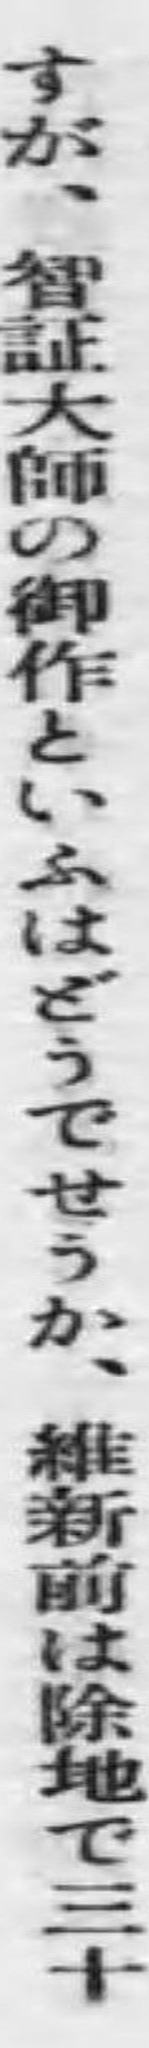すが、智証大師の御作といふはどうでせうか、維新前は除地で三十
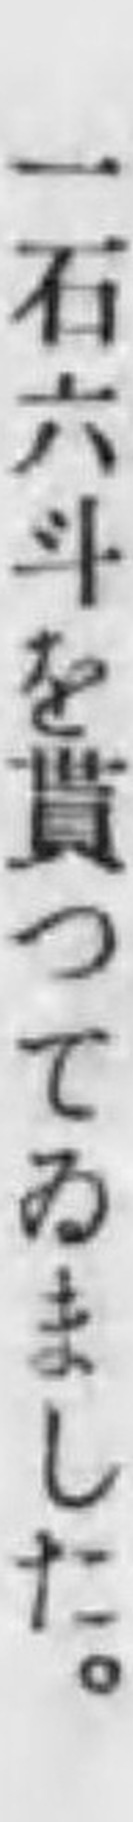一石六斗を貰つてゐました。
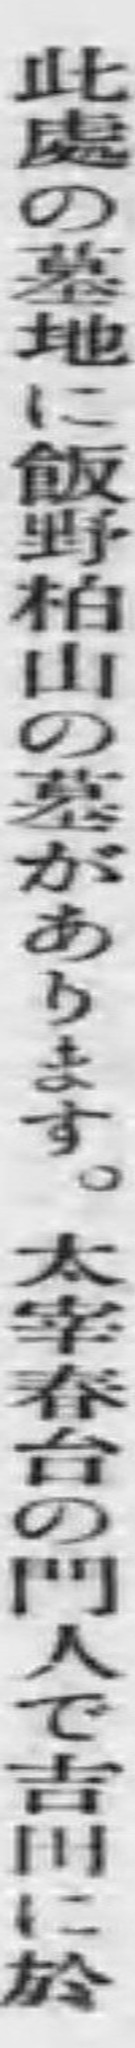此処の墓地に飯野柏山の墓があります。太宰春台の門人で吉田に於
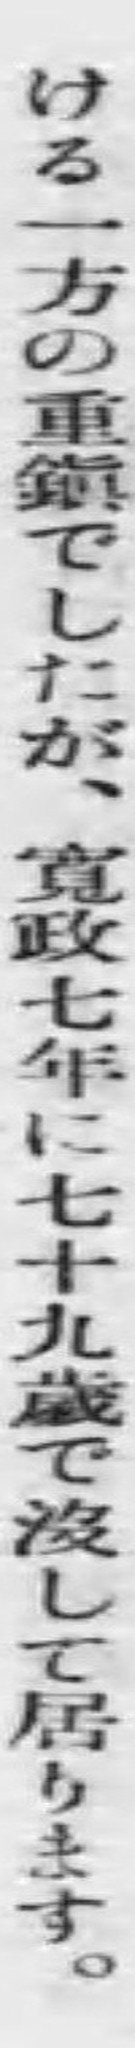ける一方の重鎮でしたが、寛政七年に七十九歳で没して居ります。
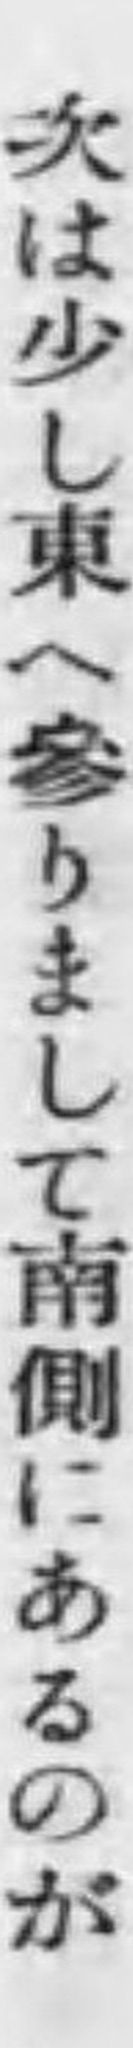次は少し東へ参りまして南側にあるのが
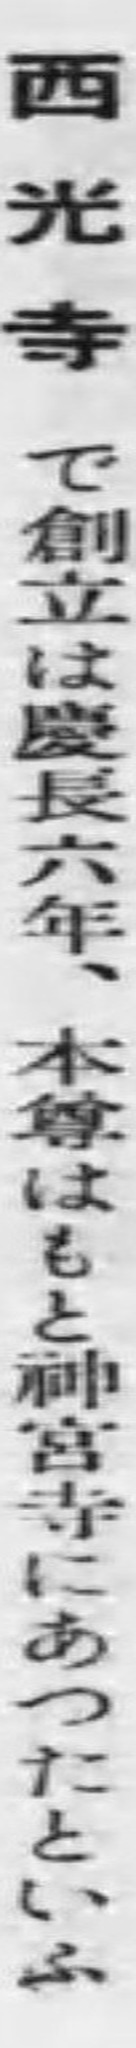西光寺で創立は慶長六年、本尊はもと神宮寺にあつたといふ
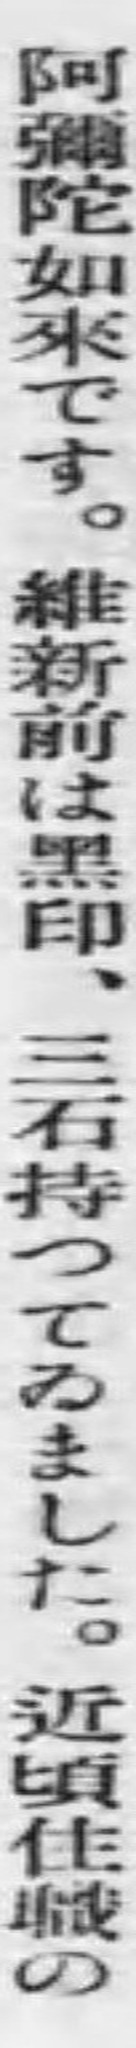阿弥陀如来です。維新前は黒印、三石持つてゐました。近頃住職の
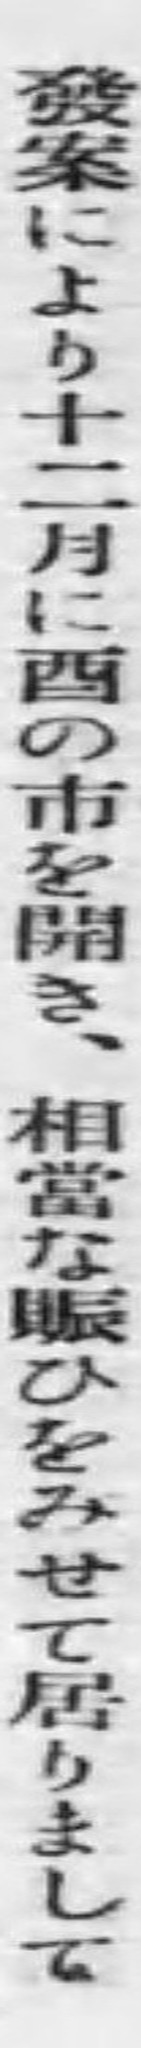発案により十二月に酉の市を開き、相当な賑ひをみせて居りまして
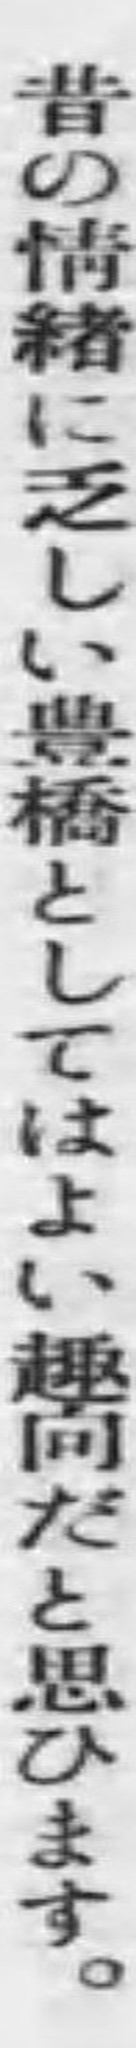昔の情緒に乏しい豊橋としてはよい趣向だと思ひます。
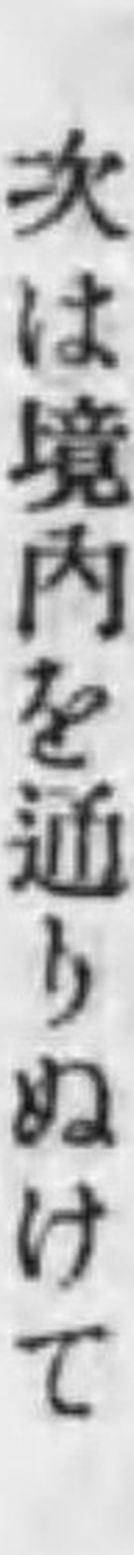次は境内を通りぬけて
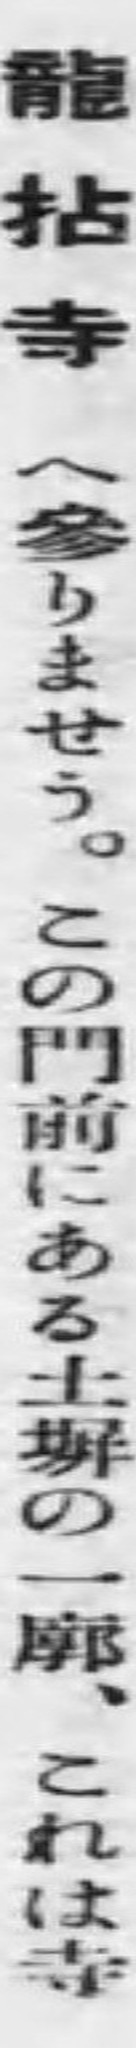龍拈寺へ参りませう。この門前にある土塀の一廓、これは寺
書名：東三河道中記 : 豊橋市及其附近案内
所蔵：国立国会図書館 National Diet Library, JAPAN
